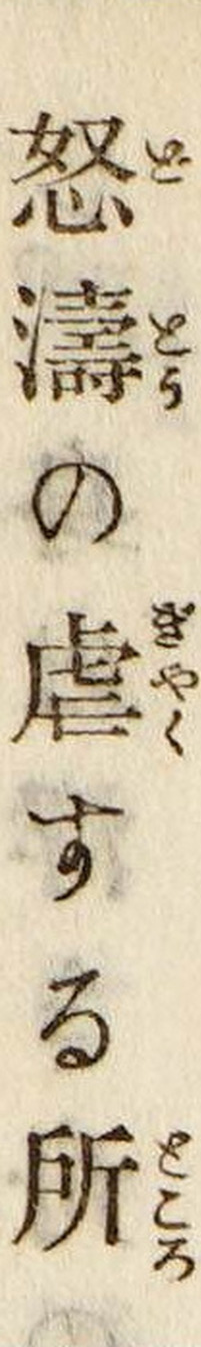怒濤の虐する所
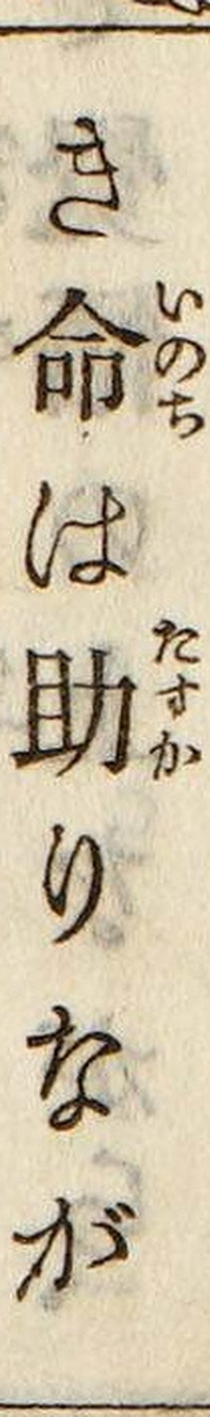き命は助りなが
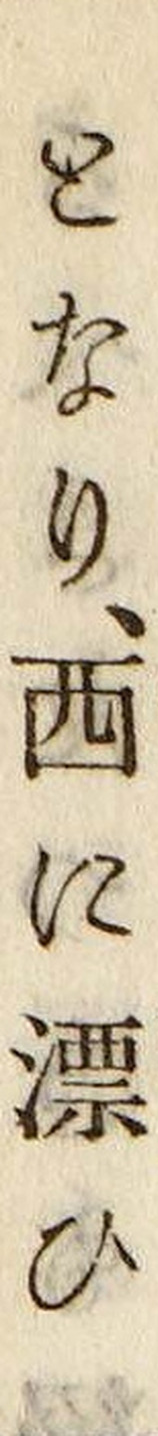となり、西に漂ひ
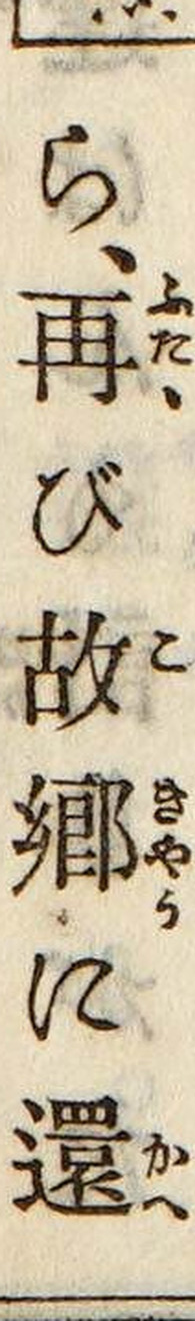ら、再び故郷に還

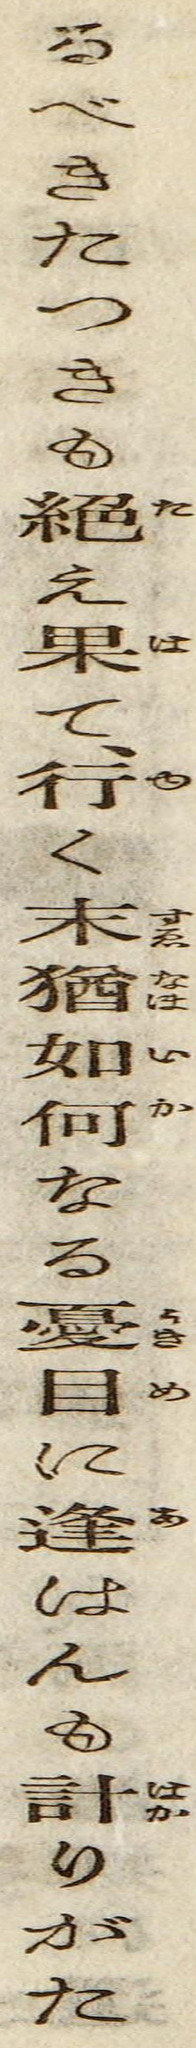るべきたつきも絶え果て、行く末猶如何なる憂目に逢はんも計りがた
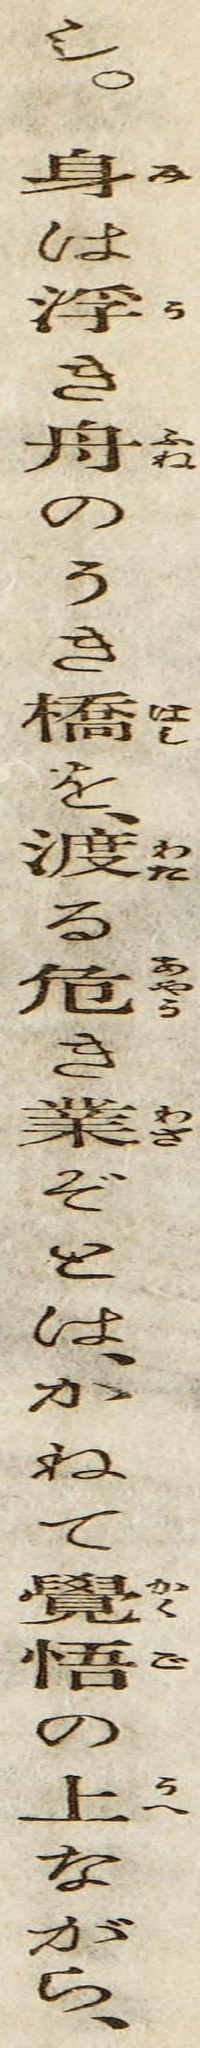し。身は浮き舟のうき橋を、渡る危き業ぞとは、かねて覚悟の上ながら、
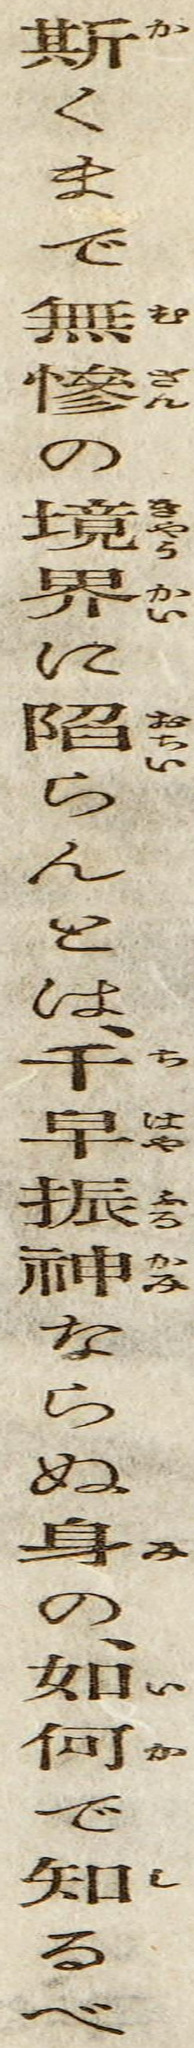斯くまで無惨の境界に陥らんとは、千早振神ならぬ身の、如何で知るべ
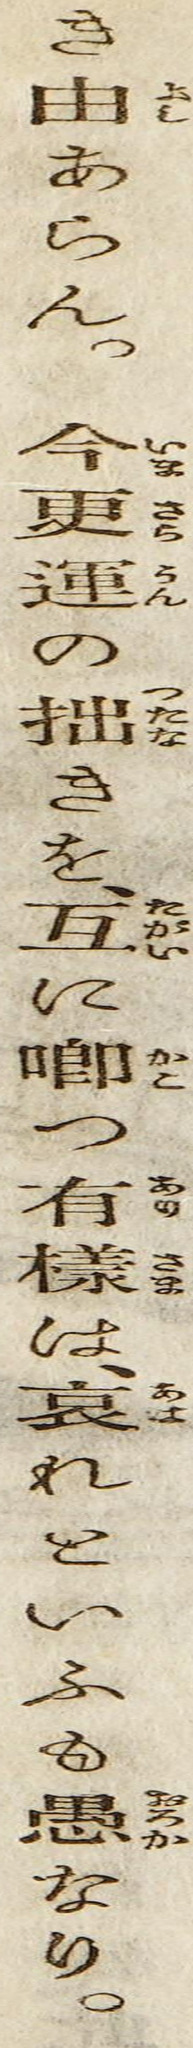き由あらん。今更運の拙きを、互に喞つ有様は、哀れといふも愚なり。
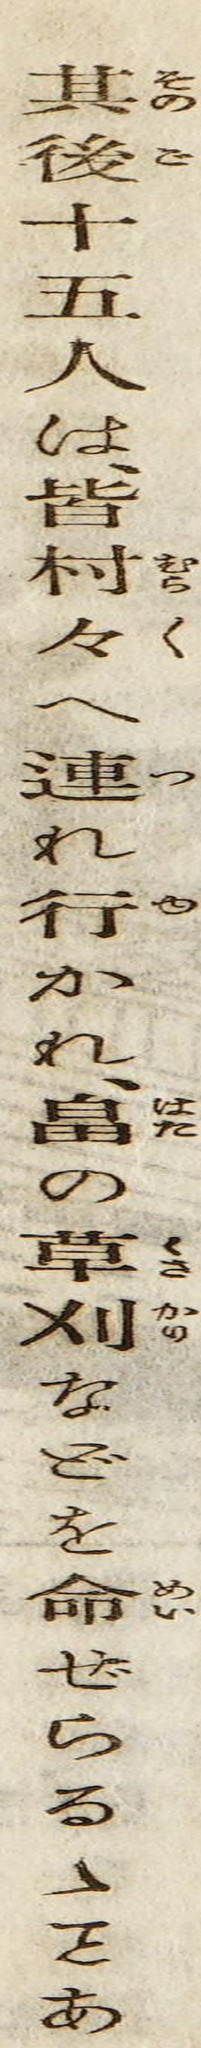其後十五人は、皆村々へ連れ行かれ、畠の草刈などを命ぜらるゝことあ
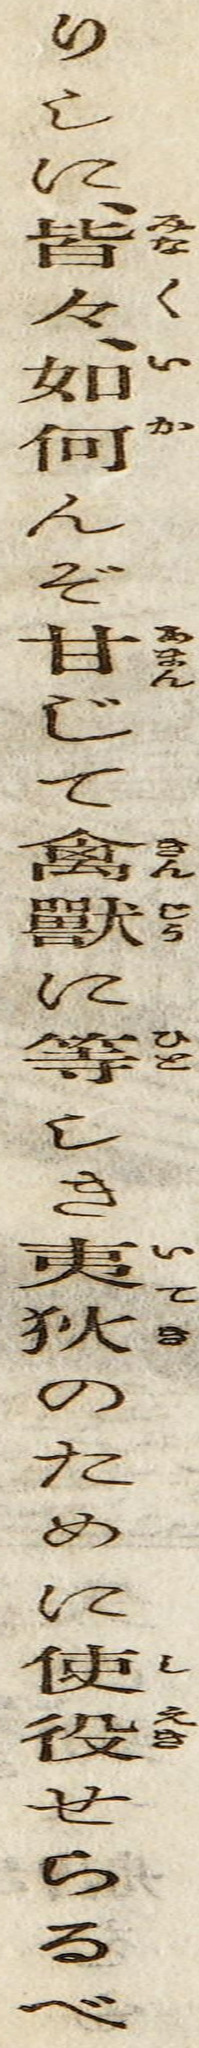りしに、皆々、如何んぞ甘じて禽獣に等しき夷狄のために使役せらるべ
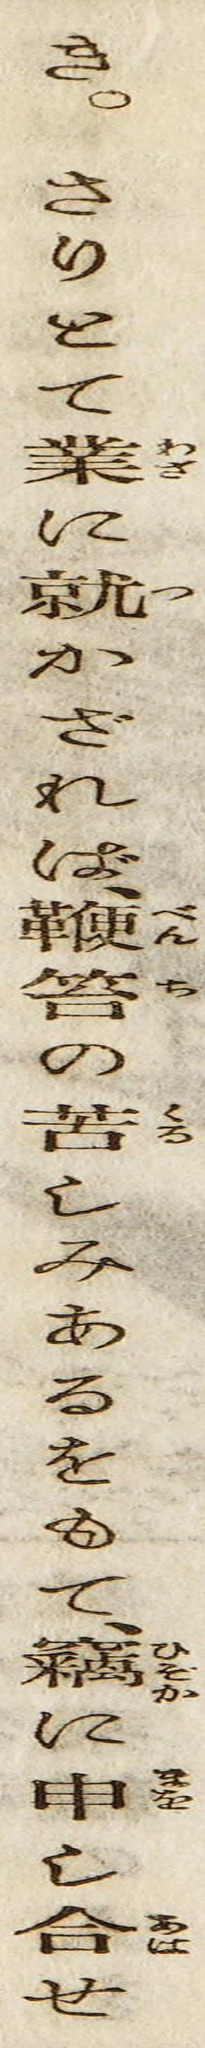き。さりとて業に就かざれば、鞭笞の苦しみあるをもて、竊に申し合せ
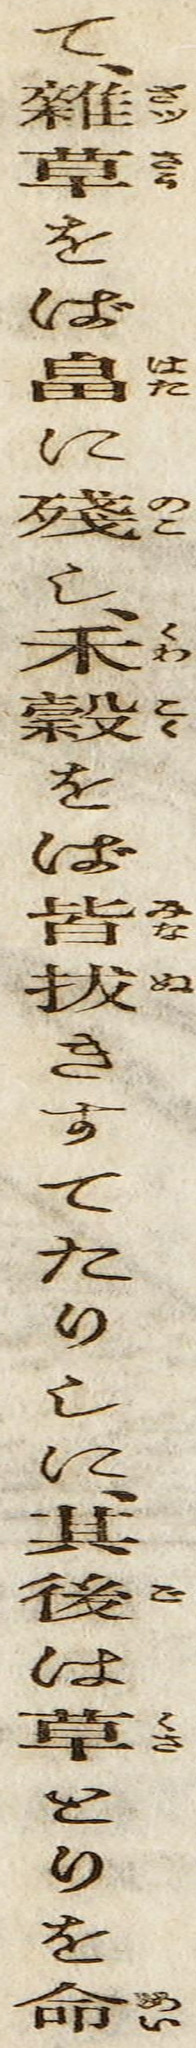て、雑草をば畠に残し、禾穀をば皆抜きすてたりしに、其後は草とりを命
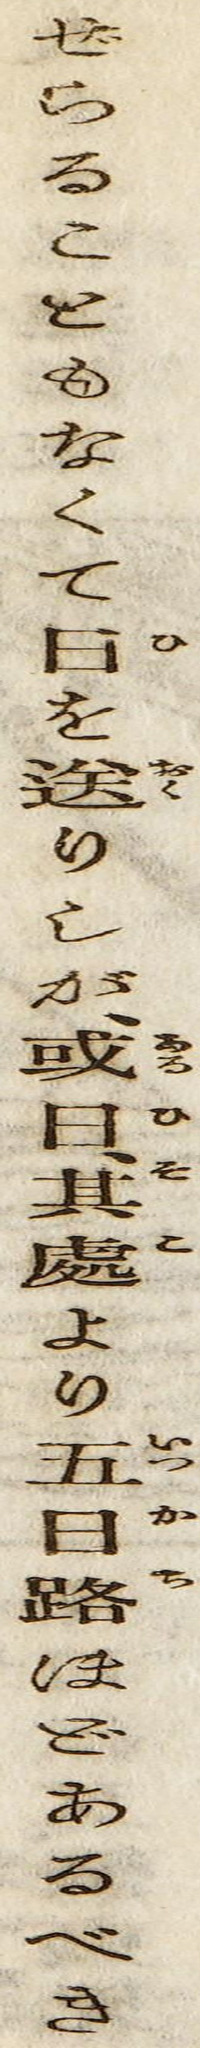ぜらることもなくて日を送りしが、或日、其処より五日路ほどあるべき
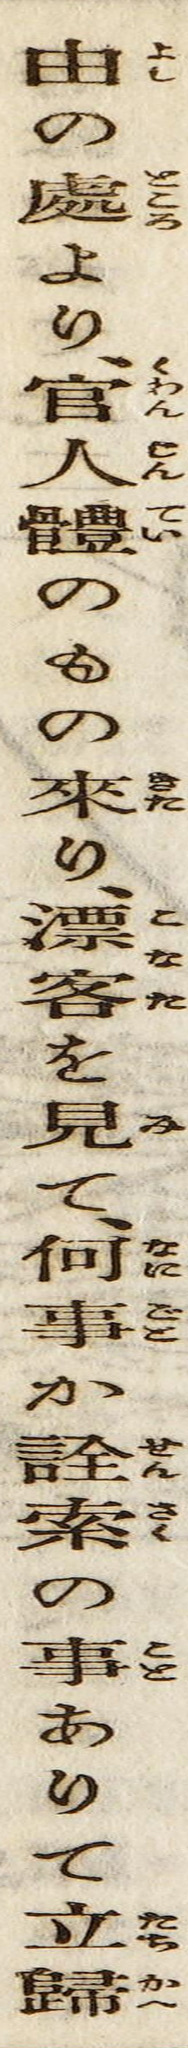由の処より、官人体のもの来り、漂客を見て、何事か詮索の事ありて立帰
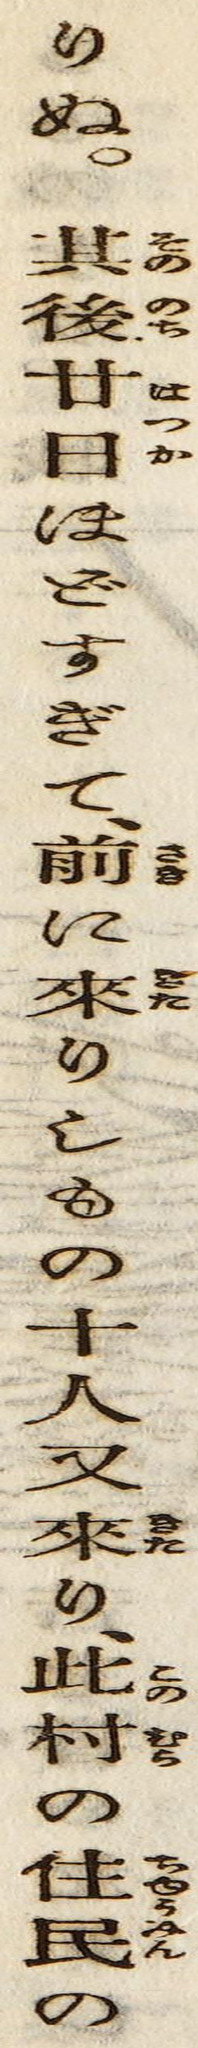りぬ。其後廿日ほどすぎて、前に来りしもの十人又来り、此村の住民の
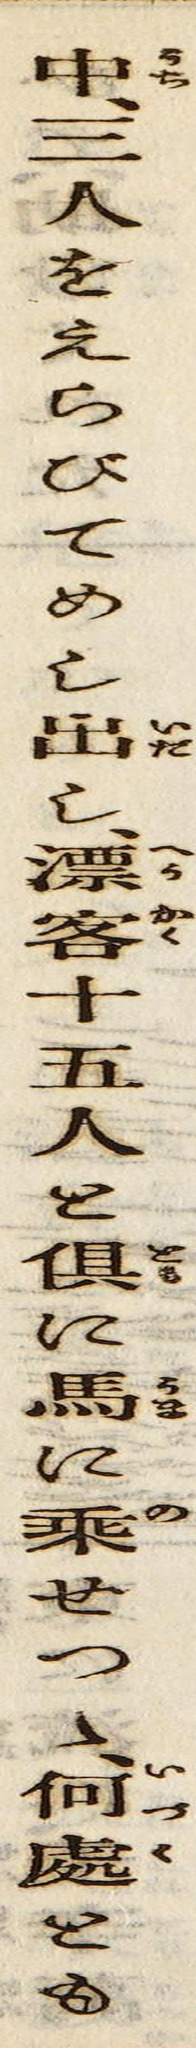中、三人をえらびてめし出し、漂客十五人と倶に馬に乗せつゝ、何処とも
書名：日本漂流譚
